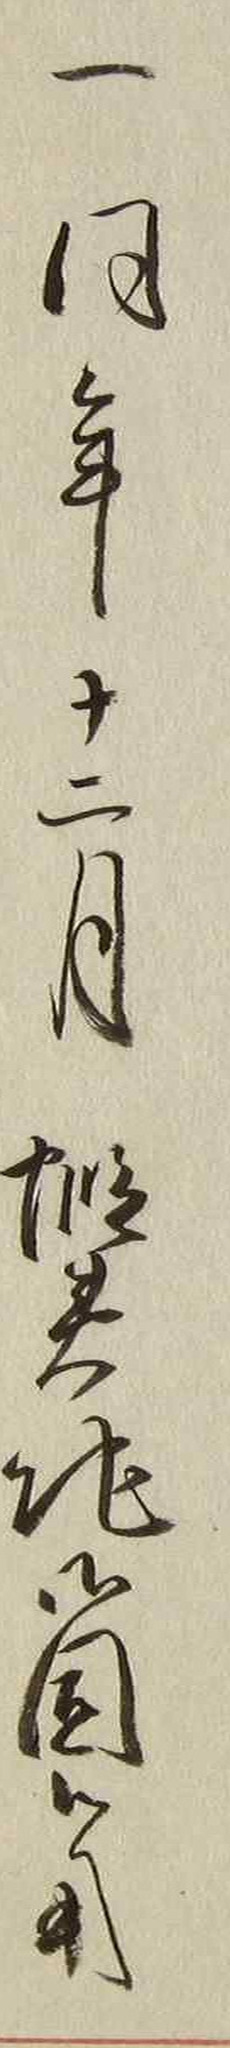一同年十二月蝦夷地御固御用
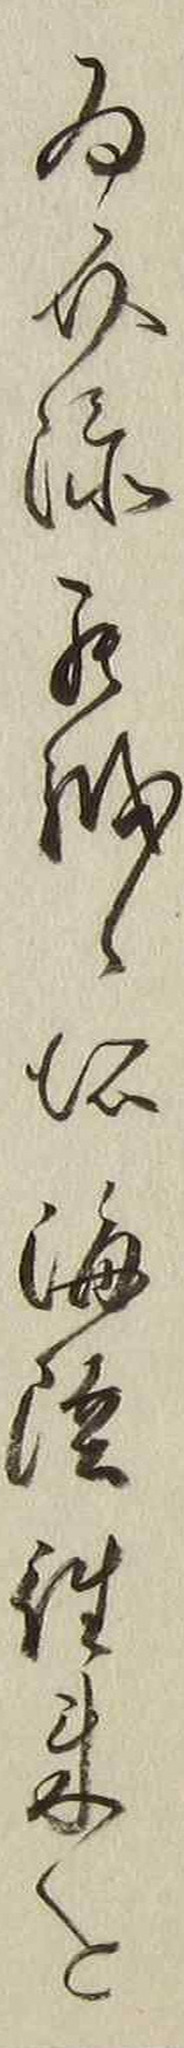為介添罷越候所海陸往来を
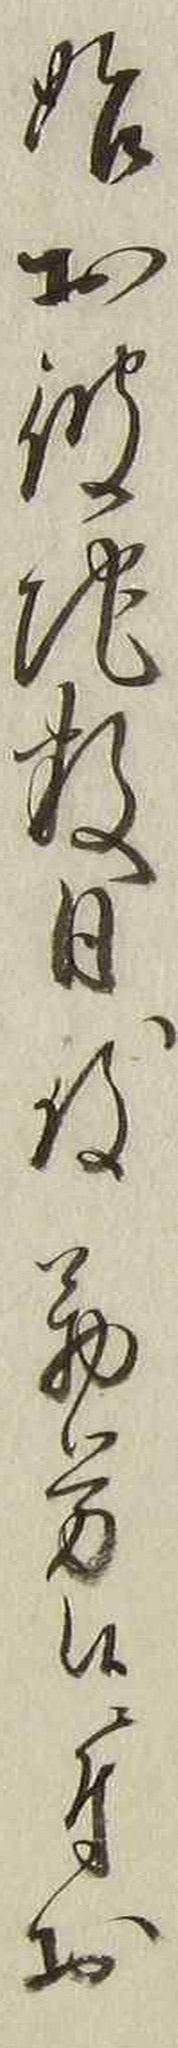始於彼地数日致勤労候ニ付於
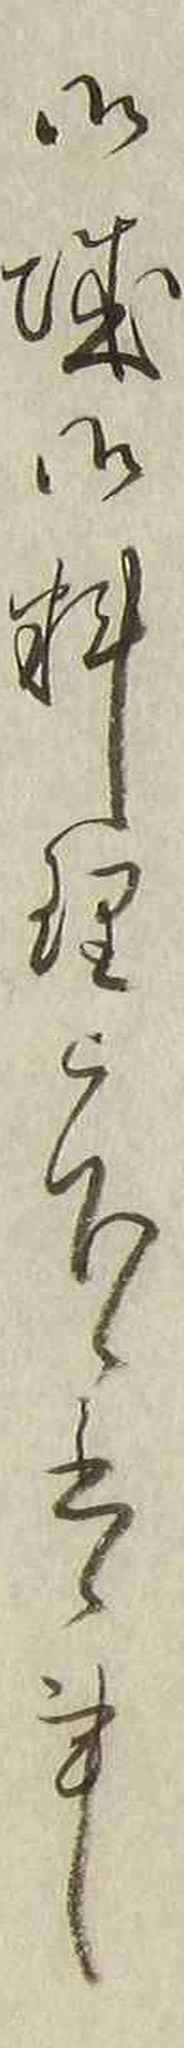御城御料理被下置候事
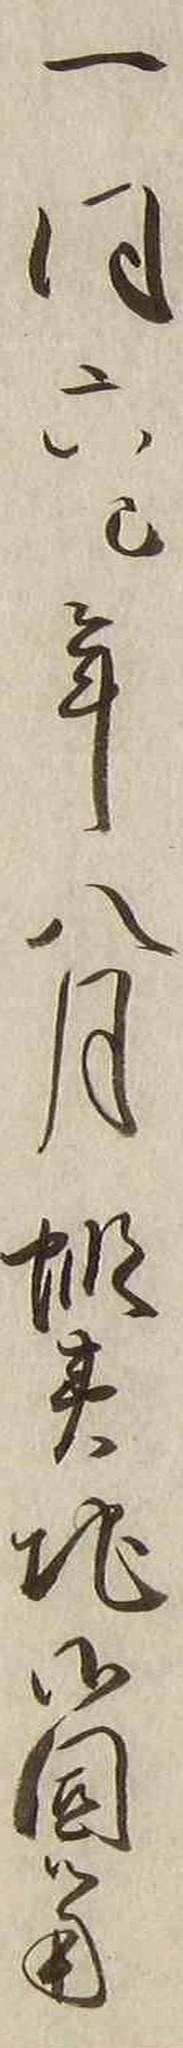一同六巳年八月蝦夷地御固御用

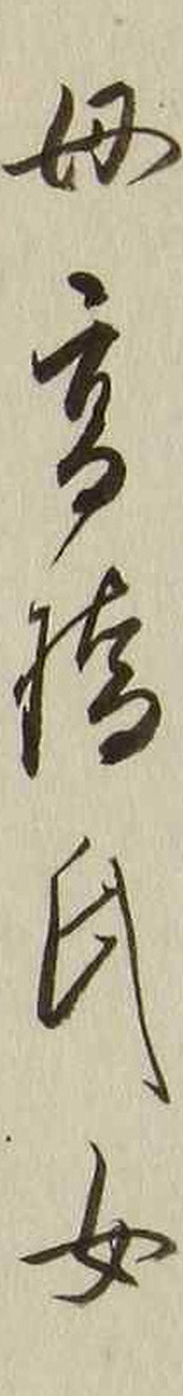母高橋氏女
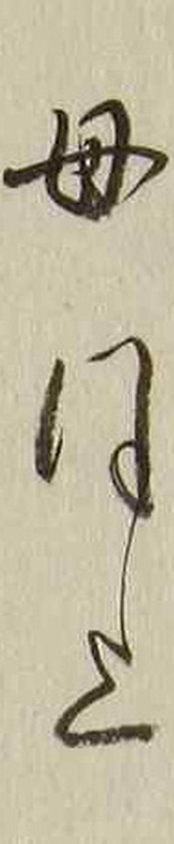母同上
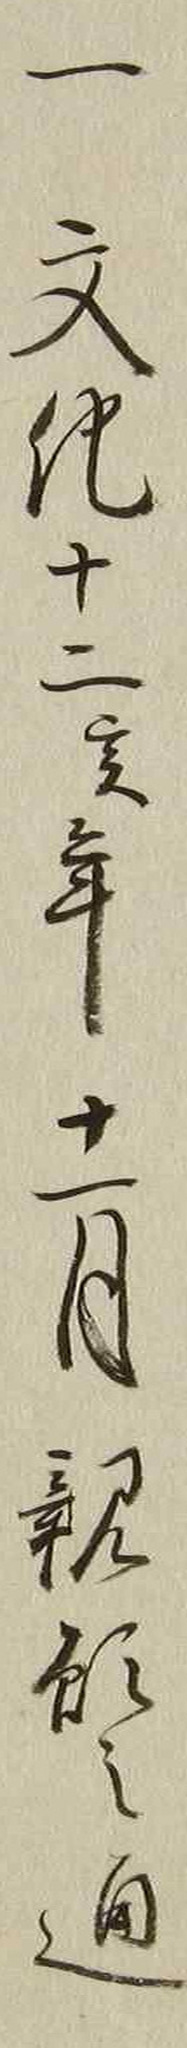一文化十二亥年十一月親願之通
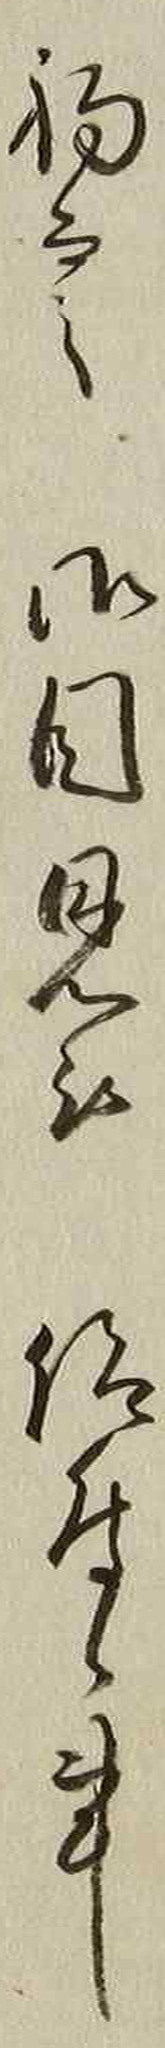初而御目見被仰付候事
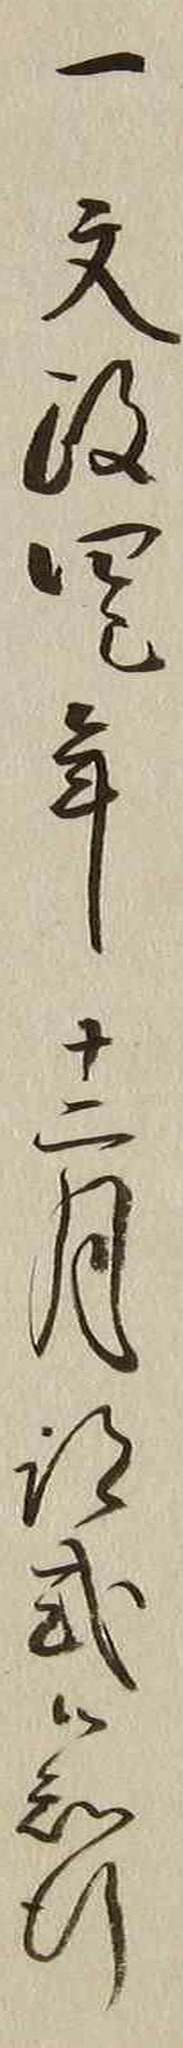一文政四巳年十二月跡式御知行
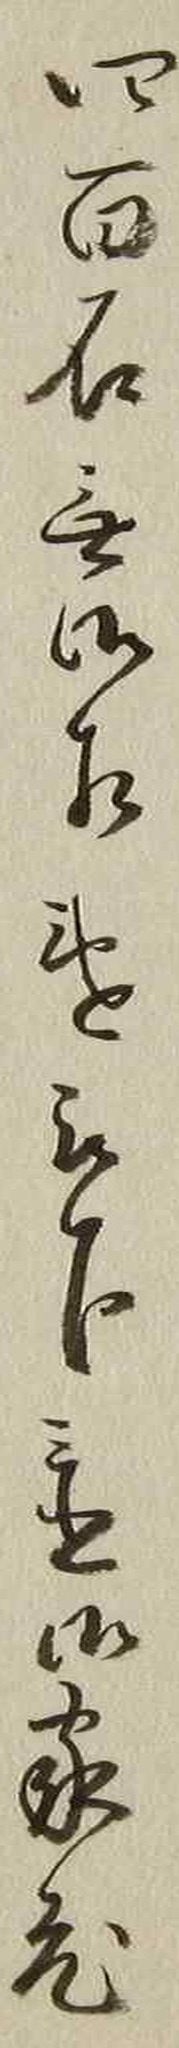四百石無御相違被下置御家老
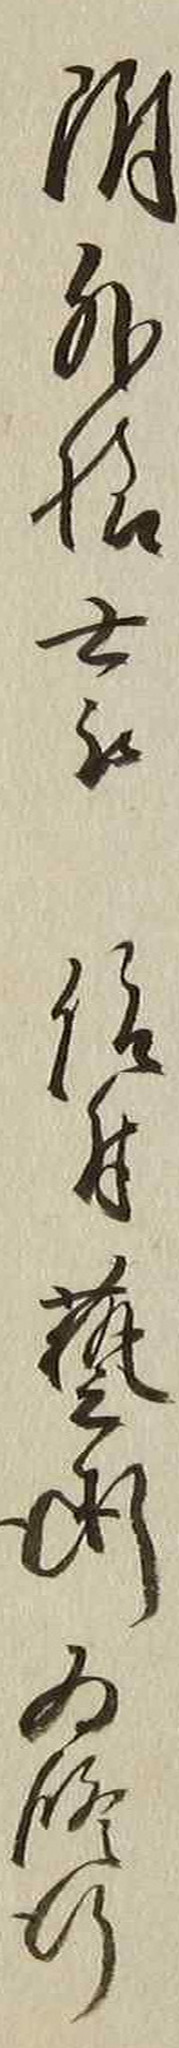附外様士被仰付芸術為修行
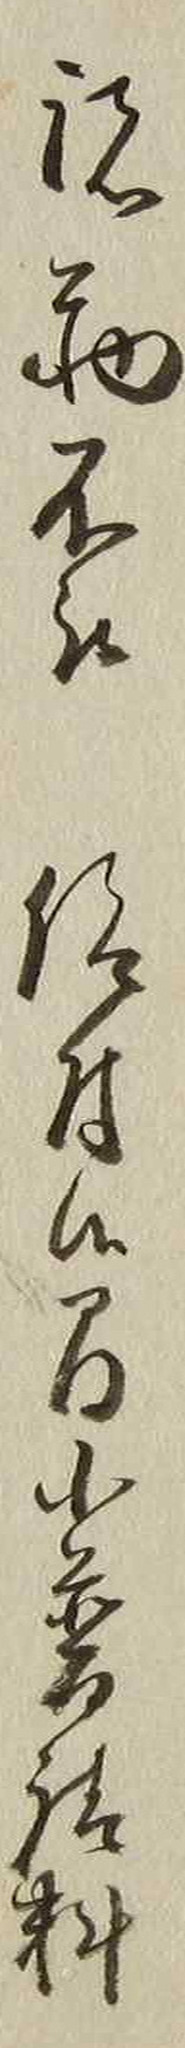諸勤不被仰付候間小普請料
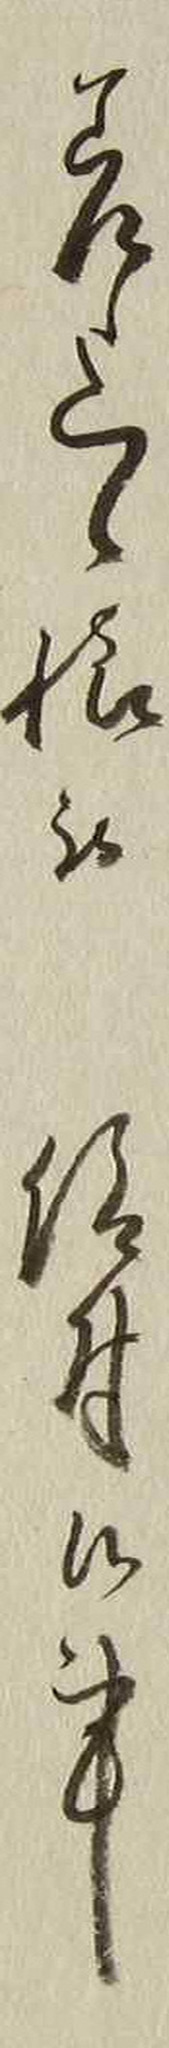差上候様被仰付候事
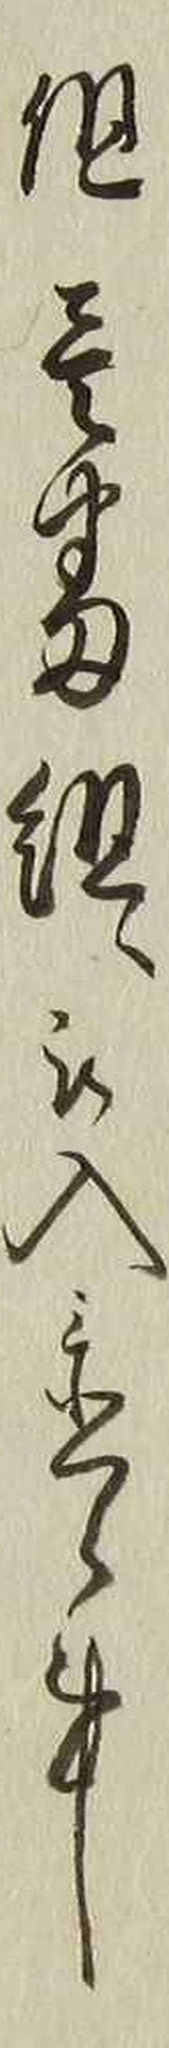但壱番組へ被入置候事
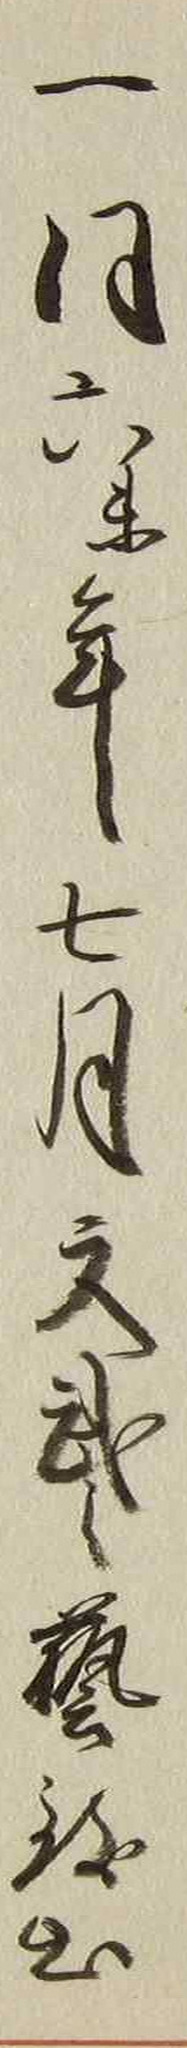一同六未年七月文武之芸致出
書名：諸士系譜　巻之18　い之部18
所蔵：会津若松市立会津図書館
